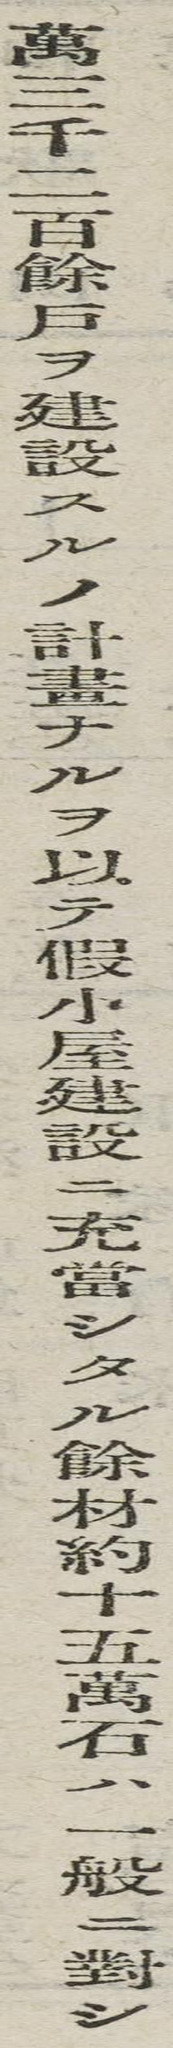万三千二百余戸ヲ建設スルノ計画ナルヲ以テ仮小屋建設ニ充当シタル余材約十五万石ハ一般ニ対シ
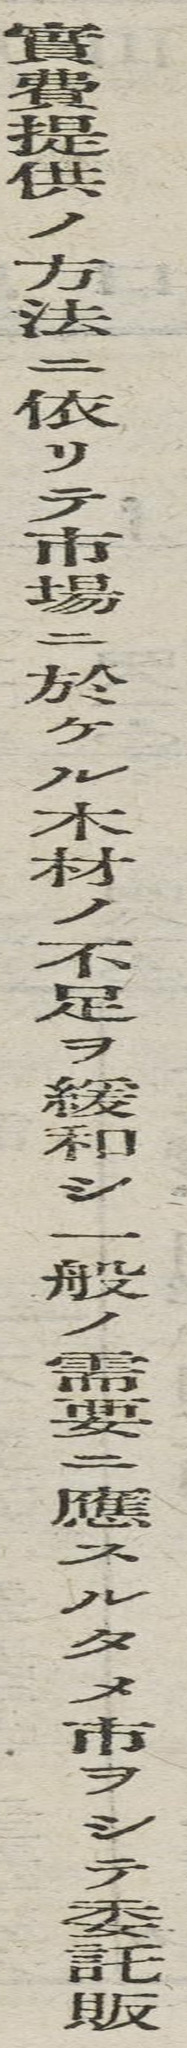実費提供ノ方法ニ依リテ市場ニ於ケル木材ノ不足ヲ緩和シ一般ノ需要ニ応スルタメ市ヲシテ委託販
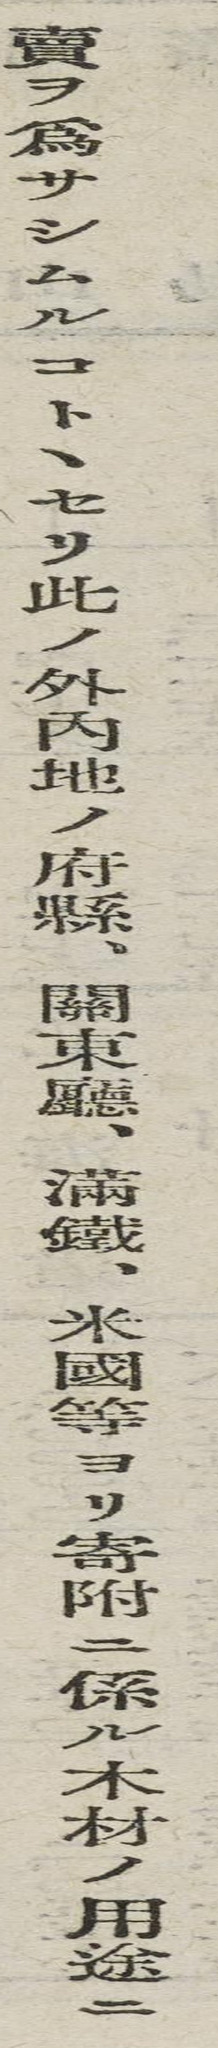売ヲ為サシムルコトヽセリ此ノ外地ノ府県、関東庁、満鉄、米国等ヨリ寄付ニ係ル木材ノ用途ニ
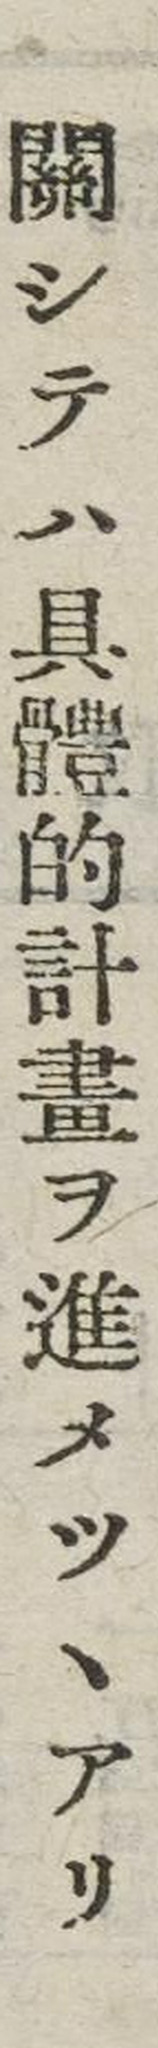関シテハ具体的計画ヲ進メツヽアリ
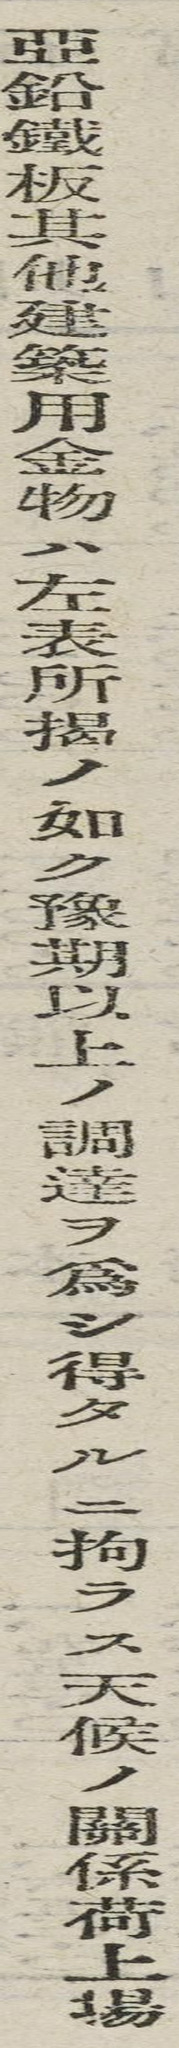亜鉛鉄板其他建築用金物ハ左表所掲ノ如ク予期以上ノ調達ヲ為シ得タルニ拘ラス天候ノ関係荷上場
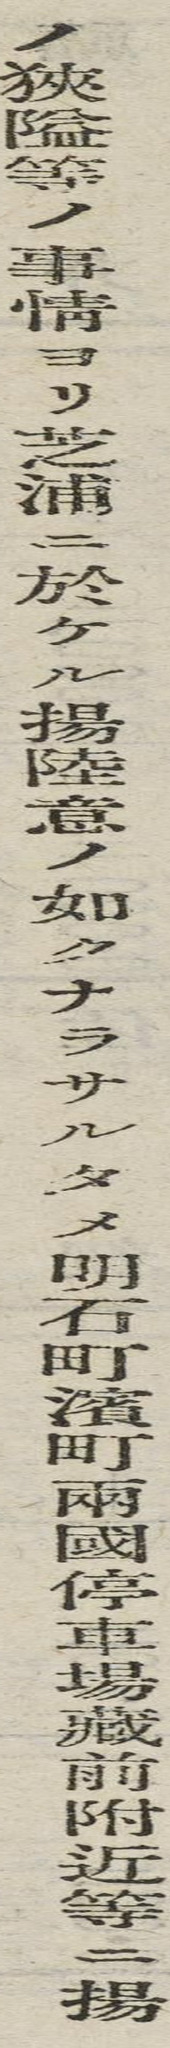ノ狭隘等ノ事情ヨリ芝浦ニ於ケル揚陸意ノ如クナラサルタメ明石町浜町両国停車場蔵前付近等ニ揚
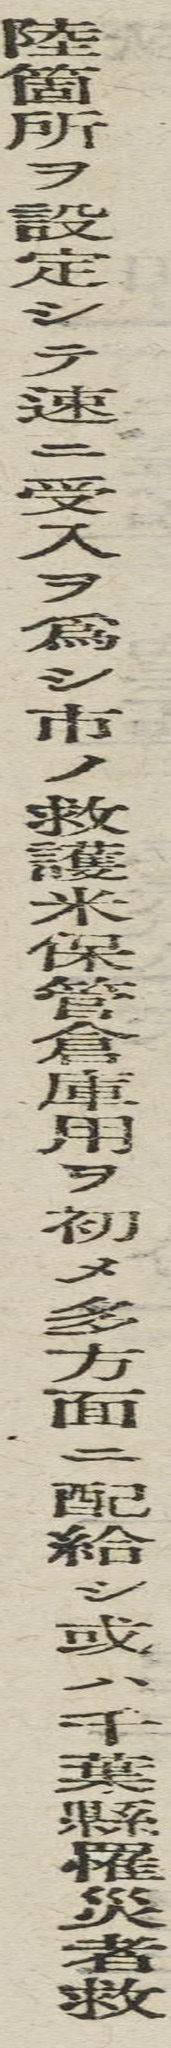陸箇所ヲ設定シテ速ニ受入ヲ為シ市ノ救護米保管倉庫用ヲ初メ多方面ニ配給シ或ハ千葉県罹災者救
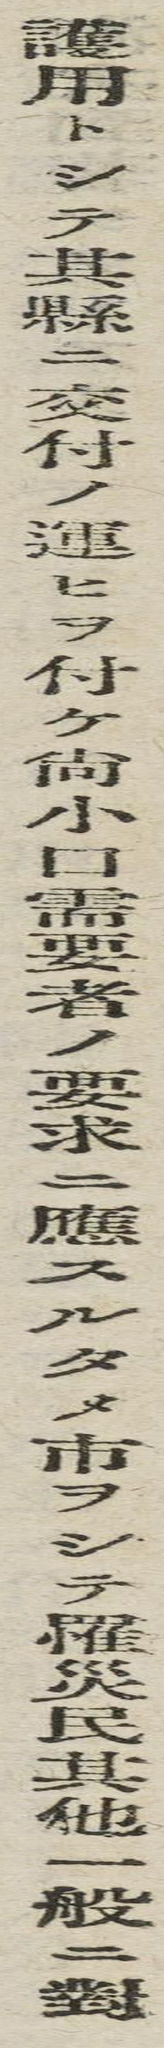護用トシテ其県ニ交付ノ運ヒヲ付ケ尚小口需要者ノ要求ニ応スルタメ市ヲ罹災民罹災民其他一般ニ対
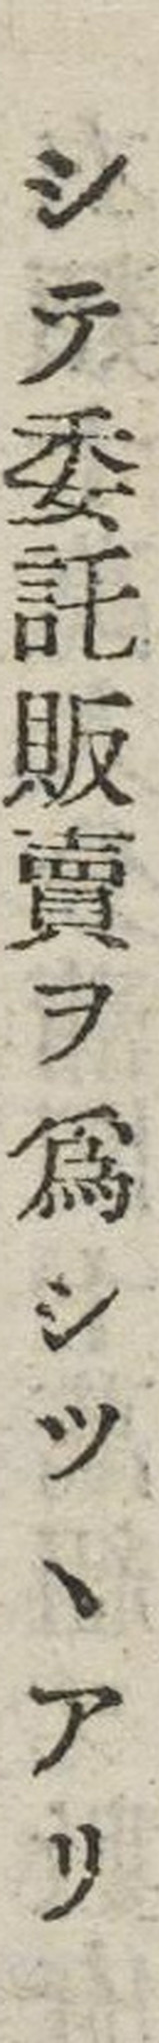シテ委託販売ヲ為シツヽアリ
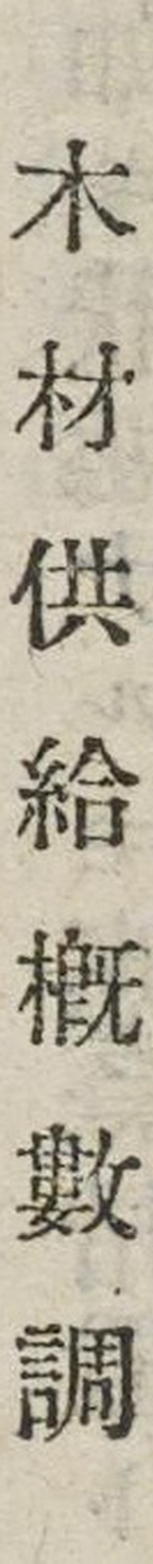木材供給概数調
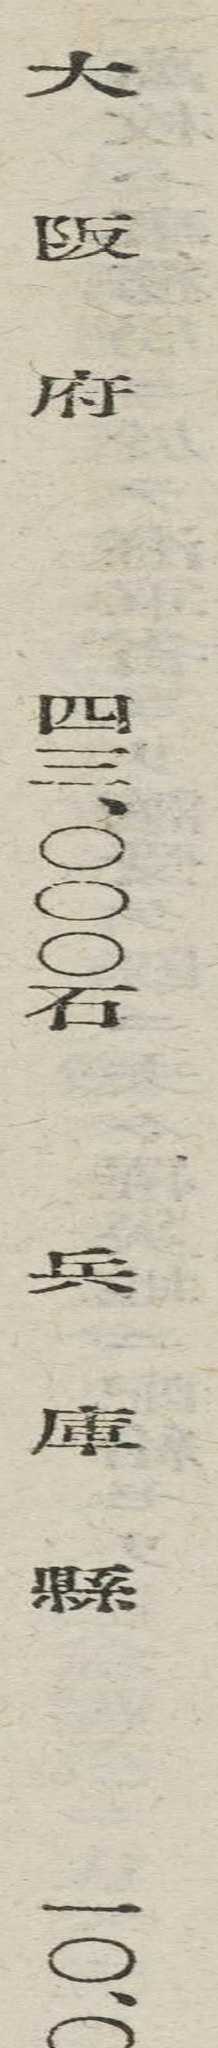大阪府四三、〇〇〇石兵庫県一〇、〇〇〇石
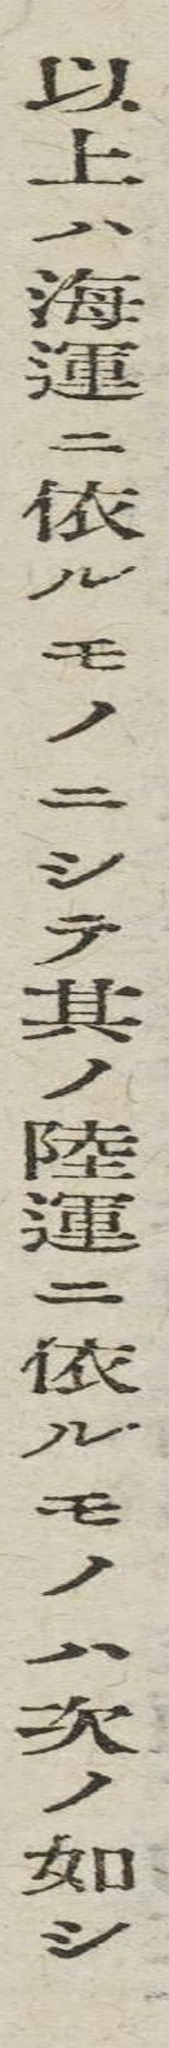以上ハ海運ニ依ルモノニシテ其ノ陸運ニ依ルモノハ次ノ如シ
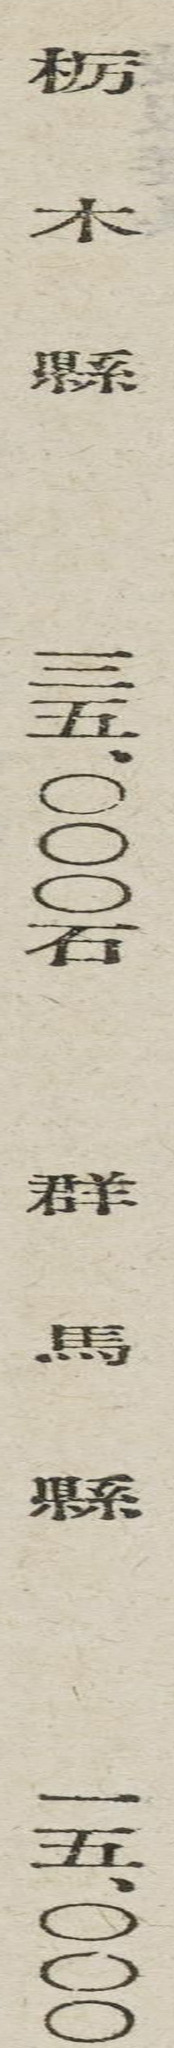栃木県三五、〇〇〇石群馬県一五、〇〇〇石
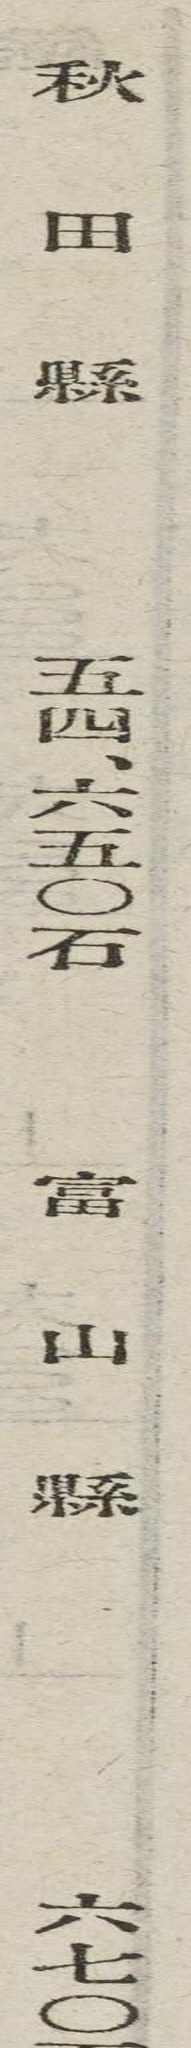秋田県五四、六五〇石富山県六七〇石
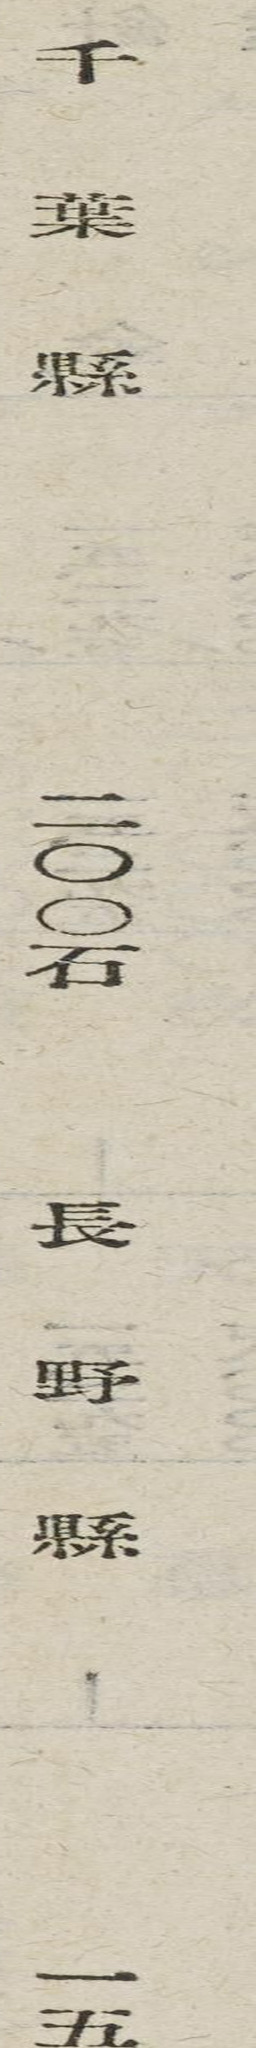千葉県二〇〇石長野県一五〇石
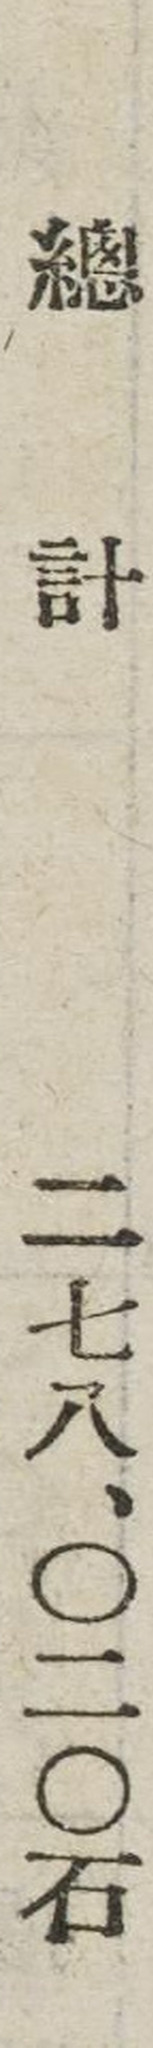総計二七八、〇二〇石
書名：震災被害状況並救護施設概要
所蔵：東京大学地震研究所図書室 Earthquake Research Institute Library, The University of Tokyo, JAPAN
